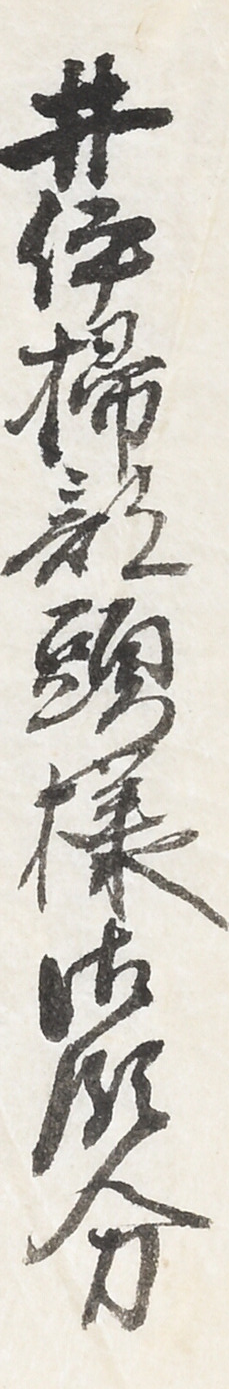井伊掃部頭様御領分
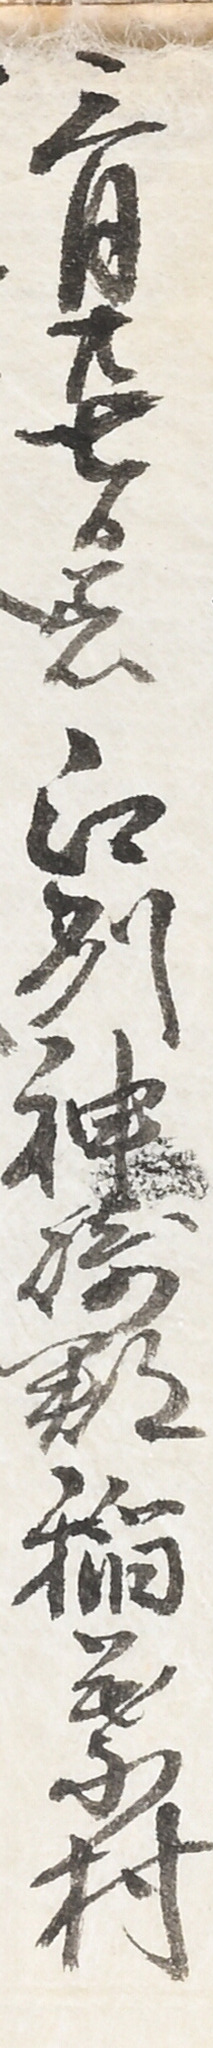三月廿七日着江州神崎郡稲葉村
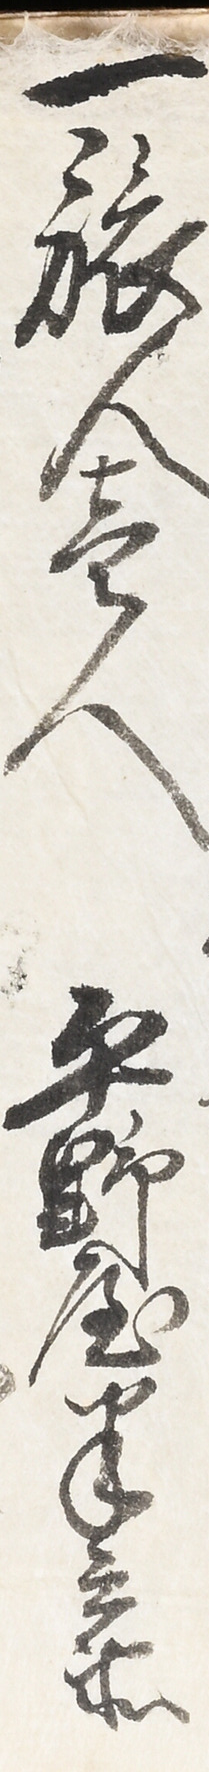一旅人壱人平野屋半兵衛
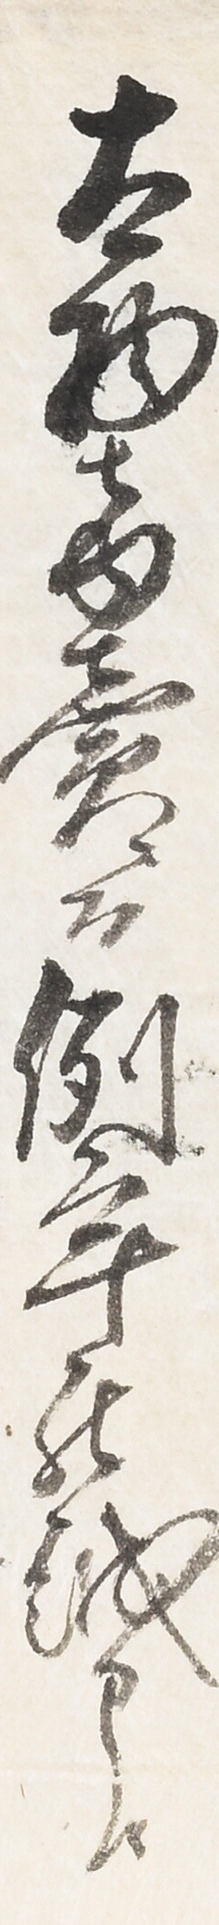太物商売ニ而例年罷越申候
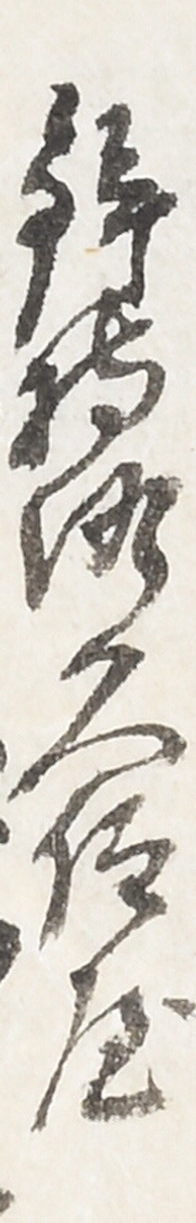鉾持町久住屋
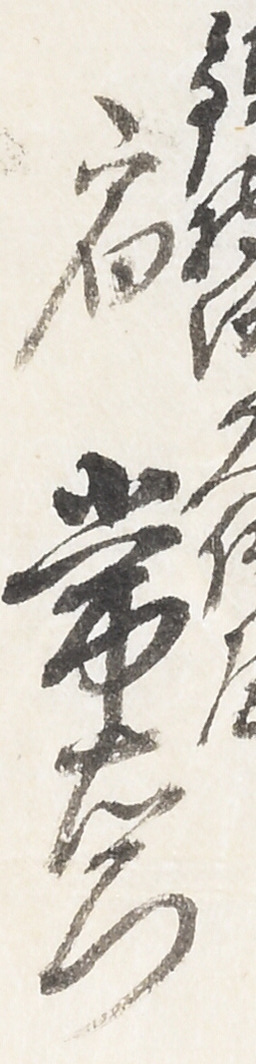宿常右衛門
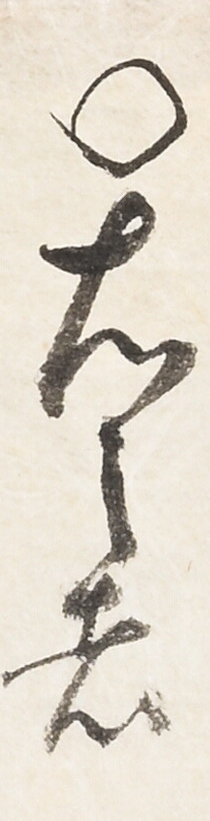〇右之者
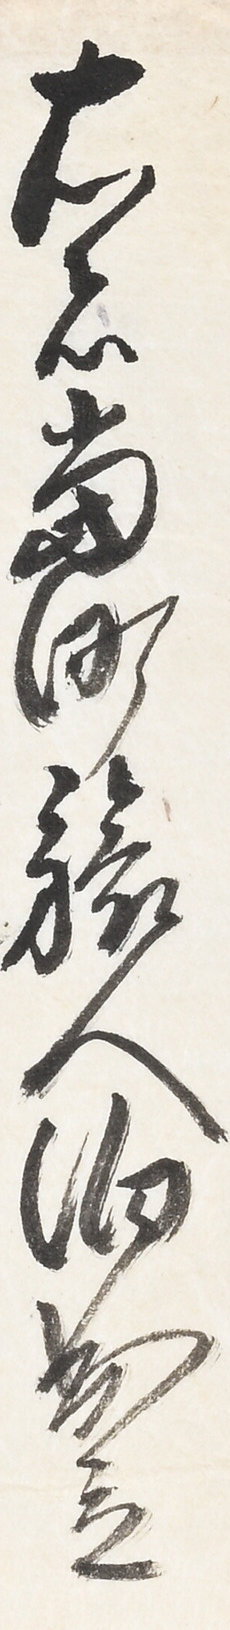右者当町旅人泊出立
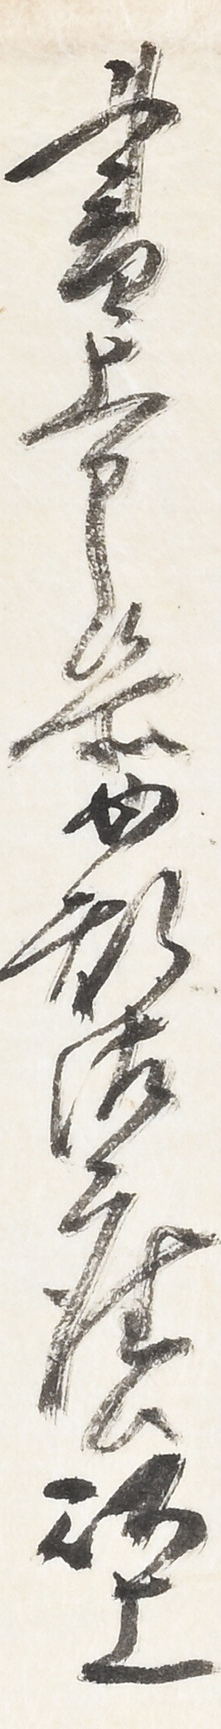書上申候所如斯御座候以上
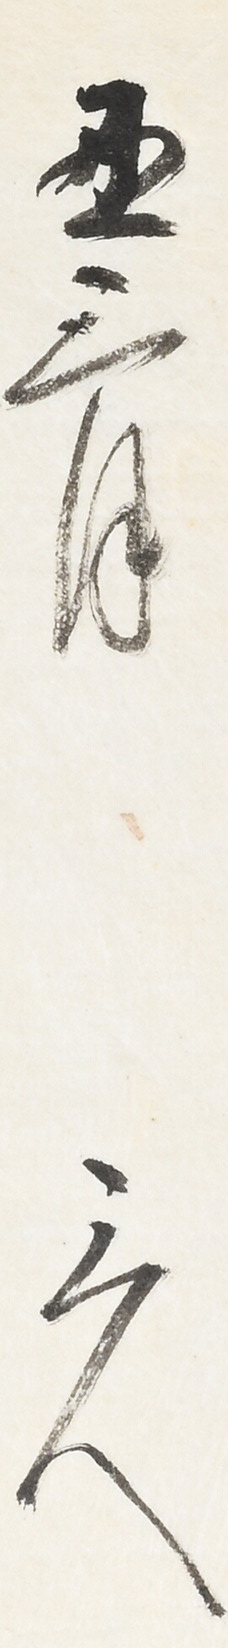丑三月三人
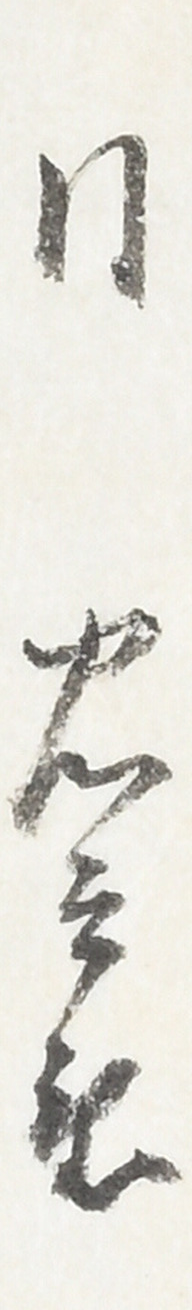同忠兵衛
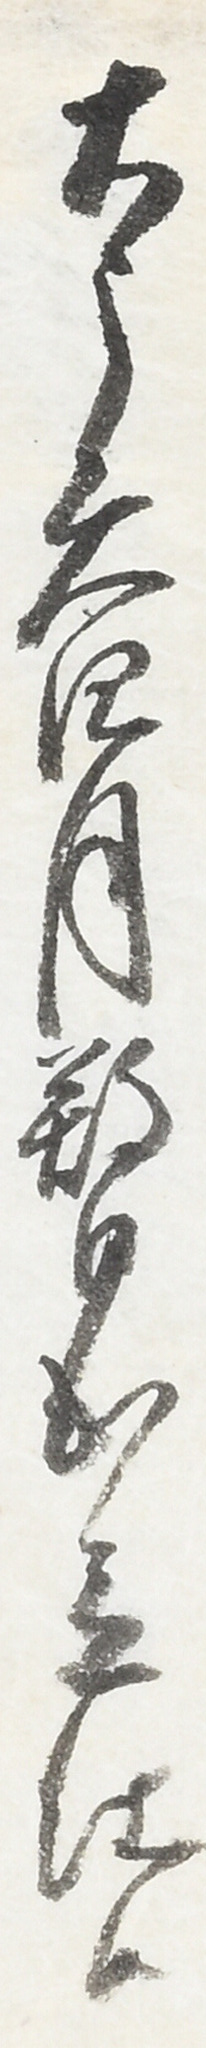右之者四月朔日出立仕候
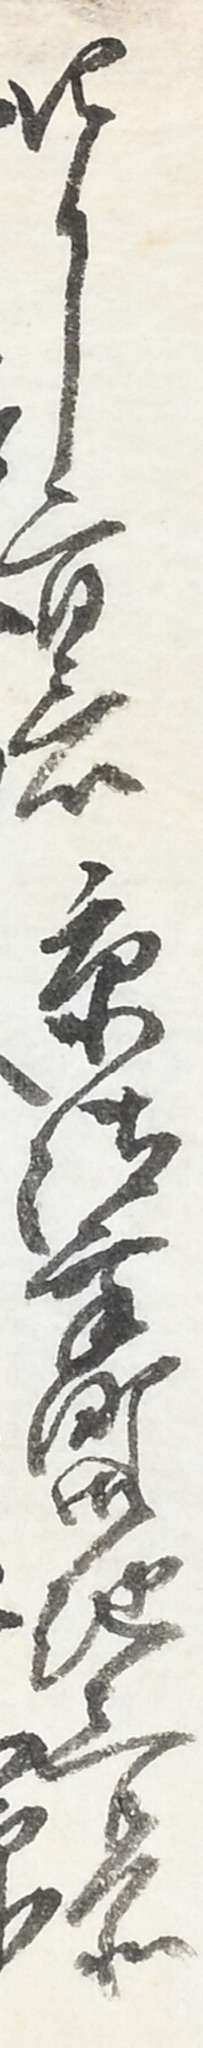四月二日着京御幸町御池上ル所
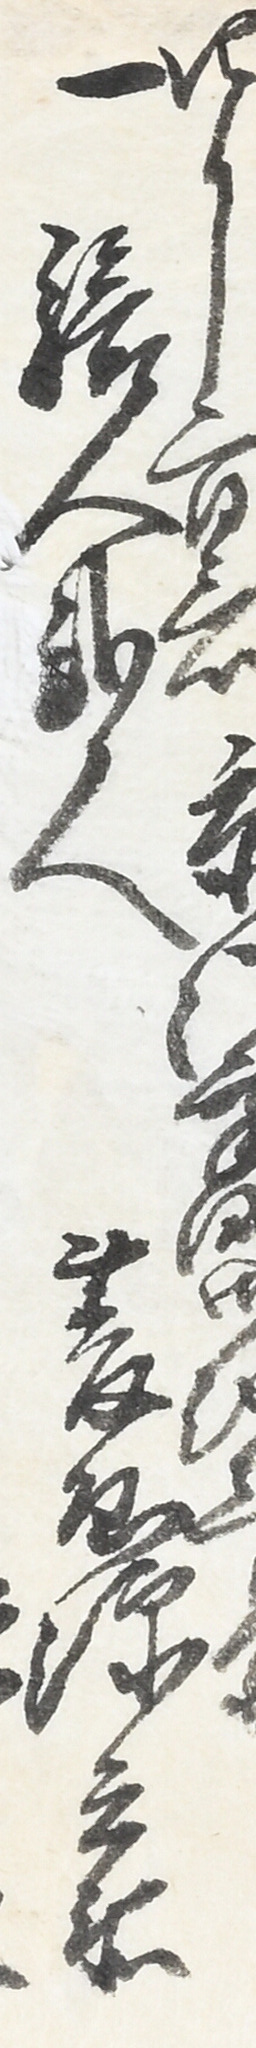一旅人弐人菱屋源兵衛
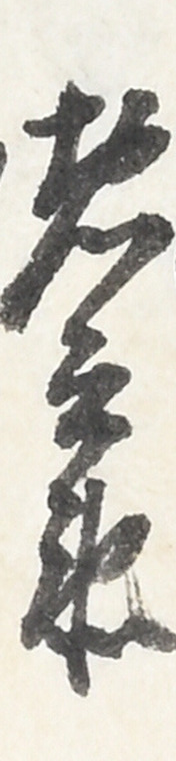惣兵衛
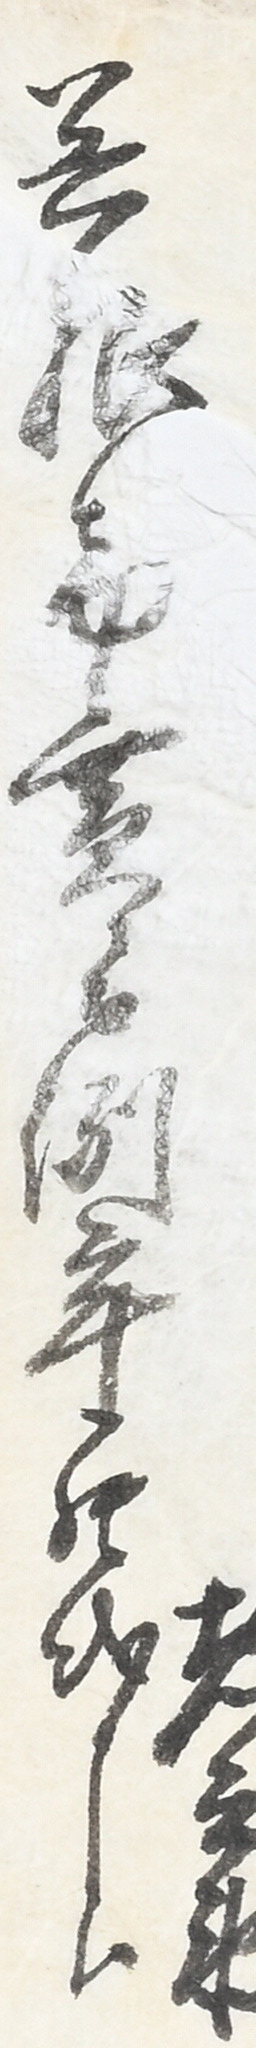呉服商売ニ而例年罷越申候
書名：旅人泊控帳
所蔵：伊那市立高遠町図書館・合同会社AMANE
